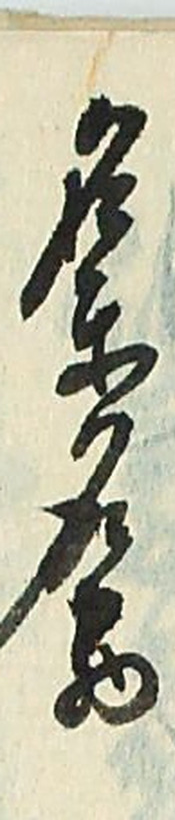名東名西
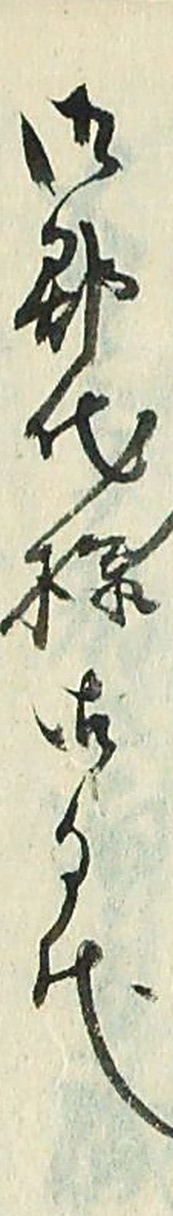御郡代様御手代
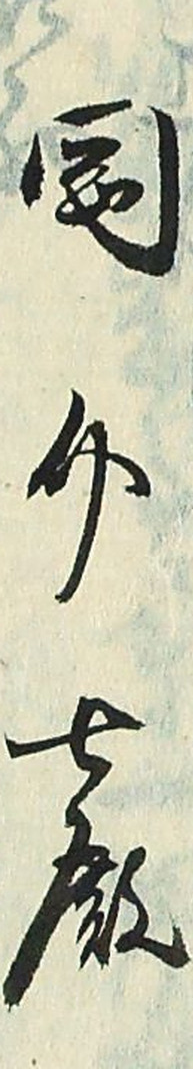岡介七殿
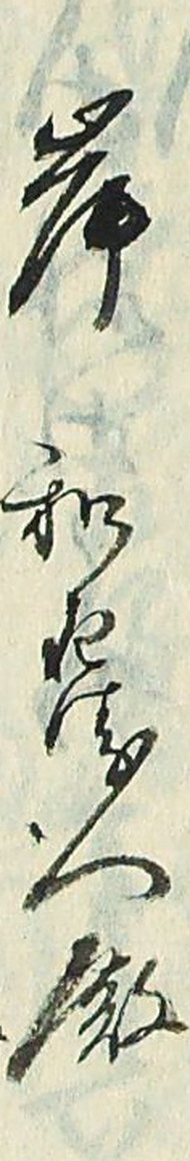岸和左衛門殿
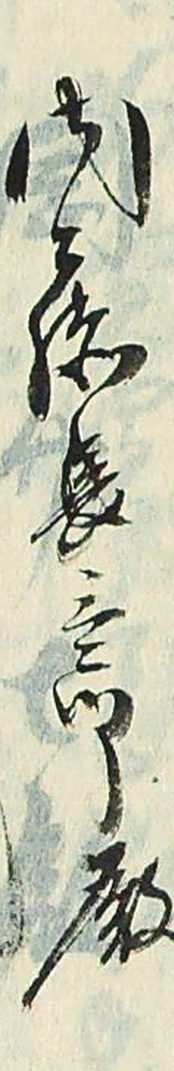内藤長三郎殿
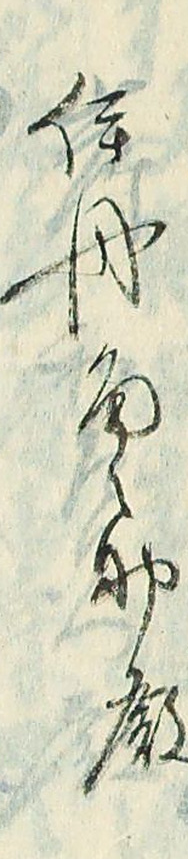伊丹角之助殿

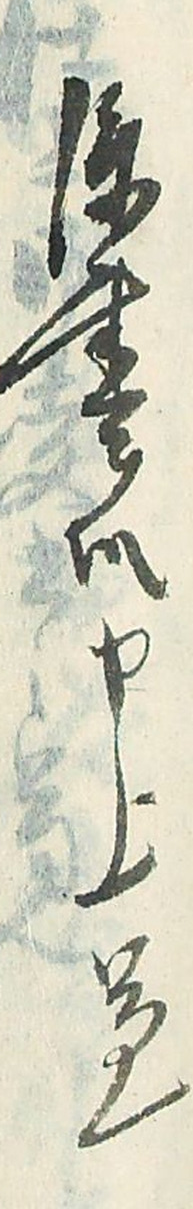添書を以申上覚
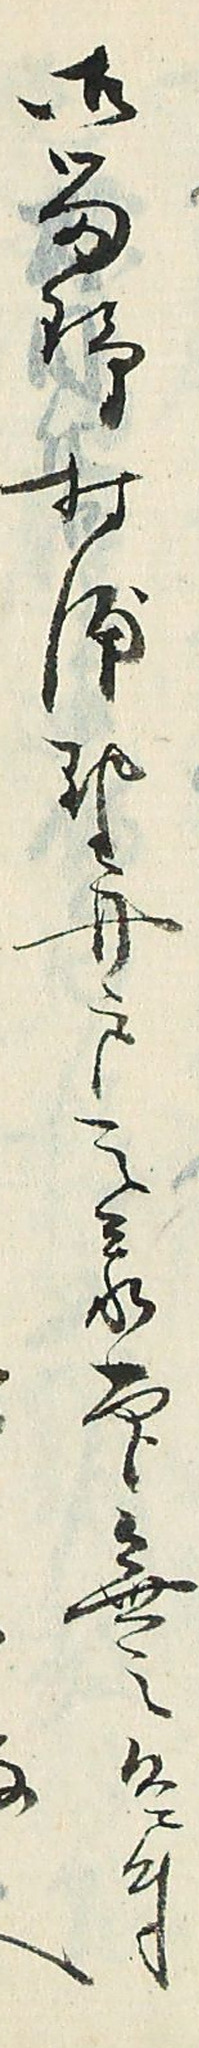御留野村浦野井戸之義印無之候に付
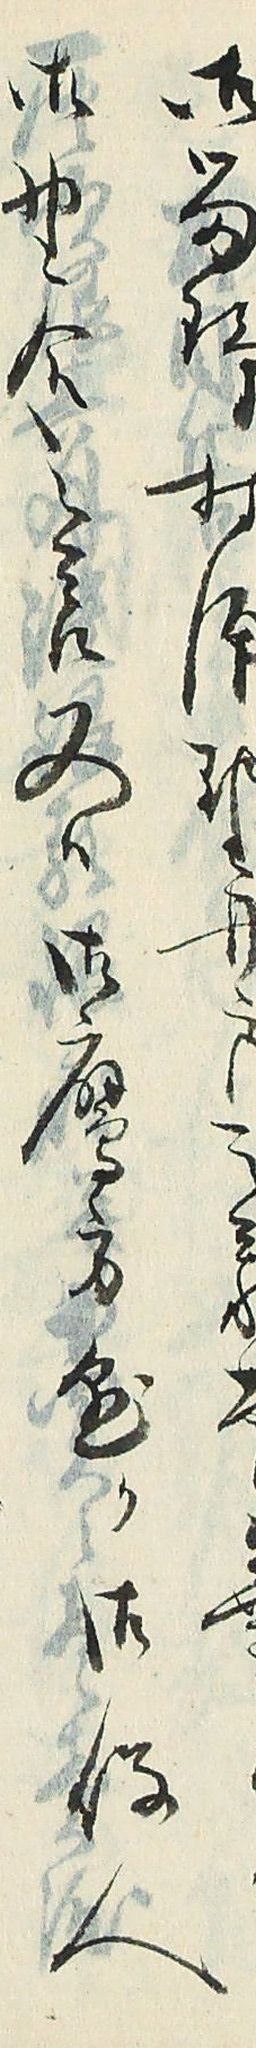御野合之節又は御鷹方懸り御役人
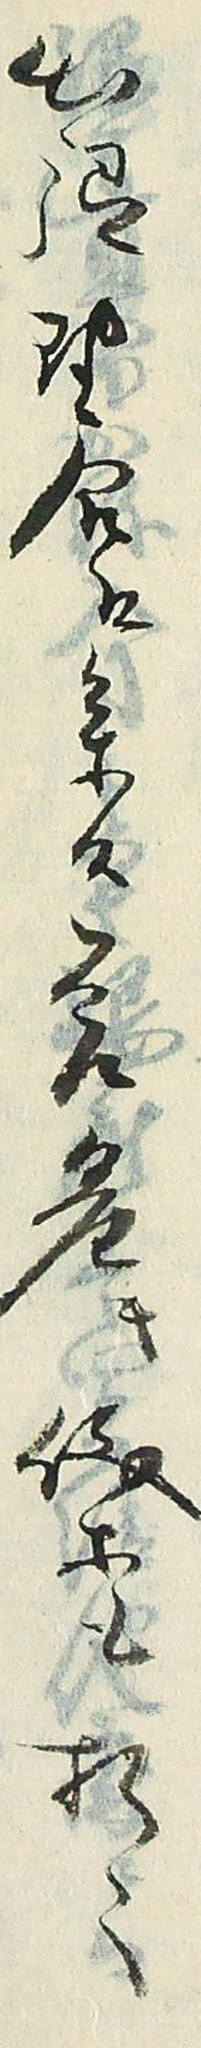出郷野合江参候節危き儀等も折々
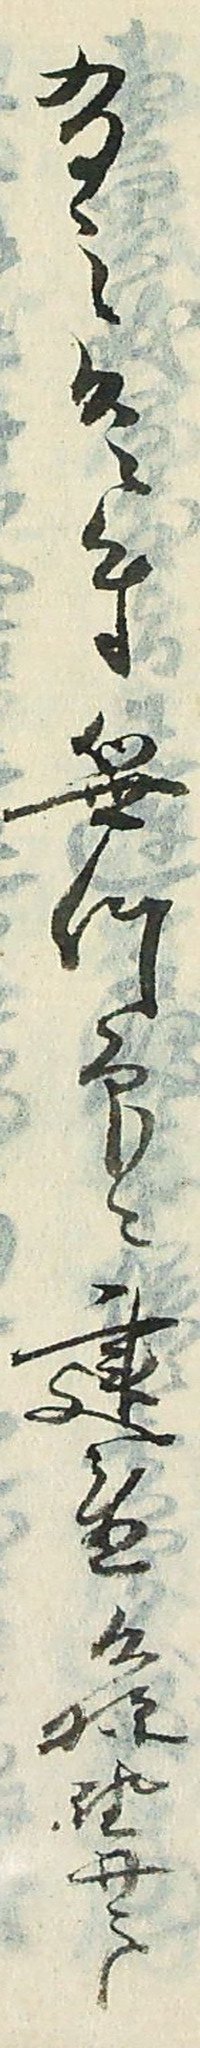有之候に付笹竹印に建置候様野井戸
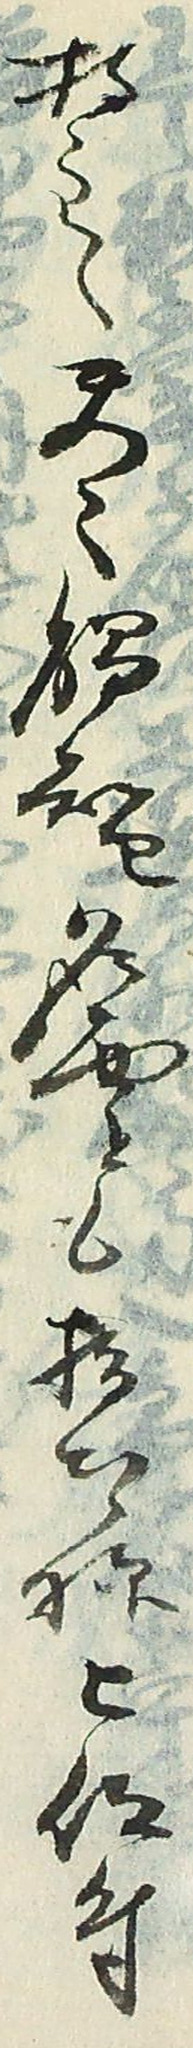持主へ夫々触知せ名面とも指出候様被仰付
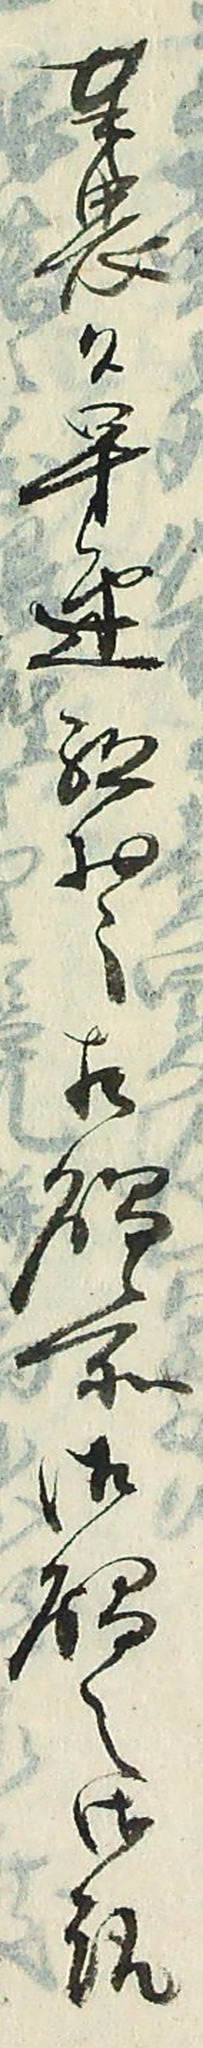奉畏候早速組村々相触候所御触之御趣
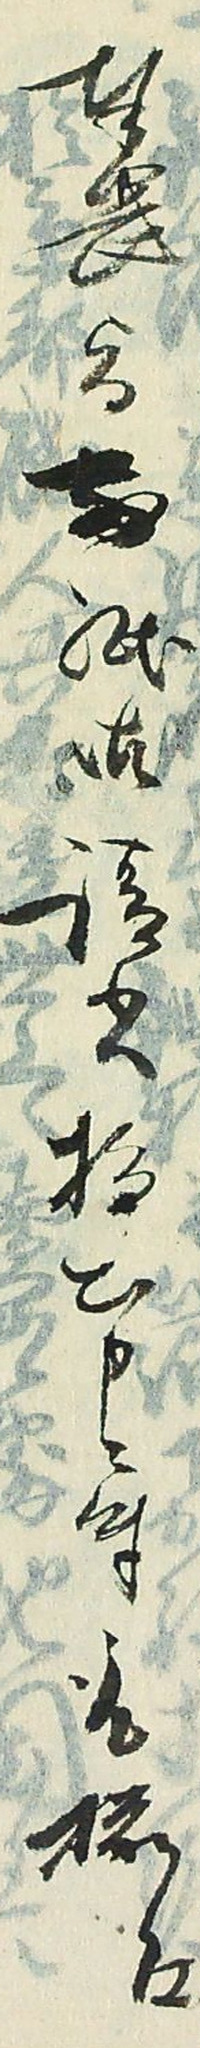奉畏旨別紙御請書指出申に付取揃江
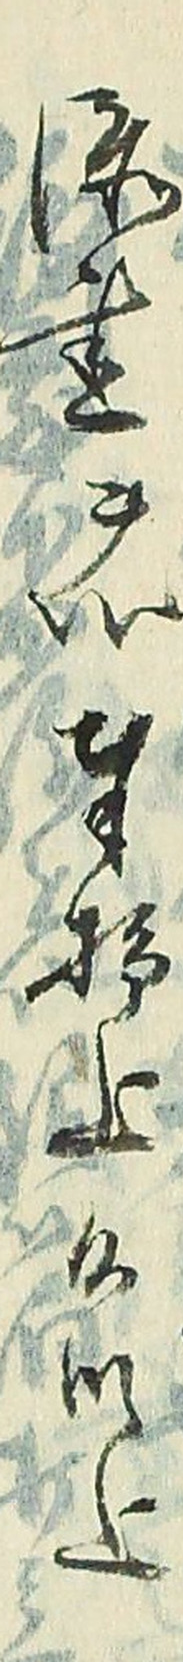添書を以奉指上候以上
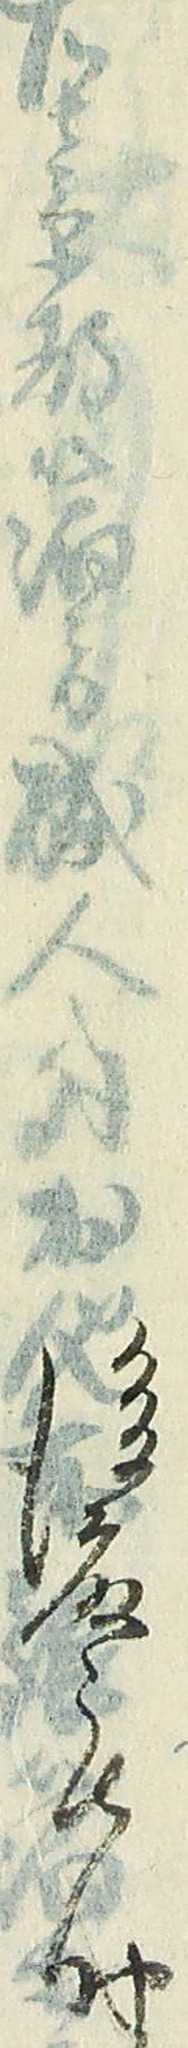後藤庄助
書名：諸御用御□受書控
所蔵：鳴門教育大学 Naruto University of Education
